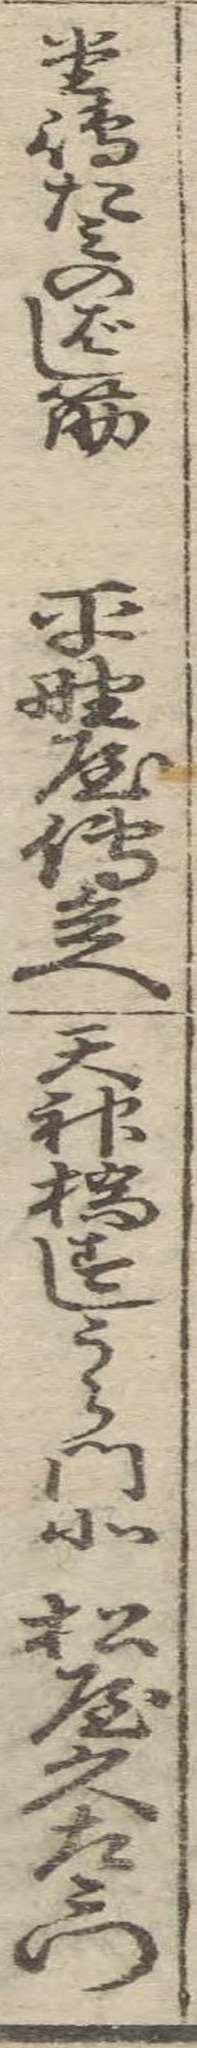堂嶋たみのばし筋平野屋伝兵へ
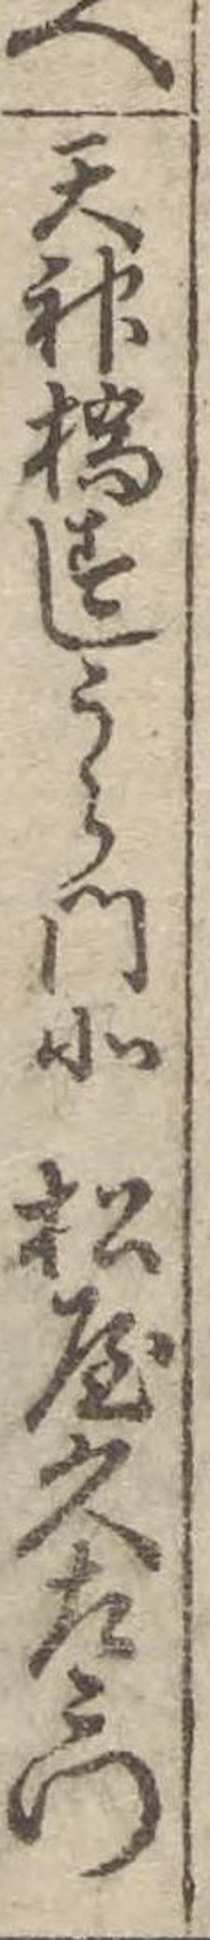天神橋すしうら門北松屋久左衛門
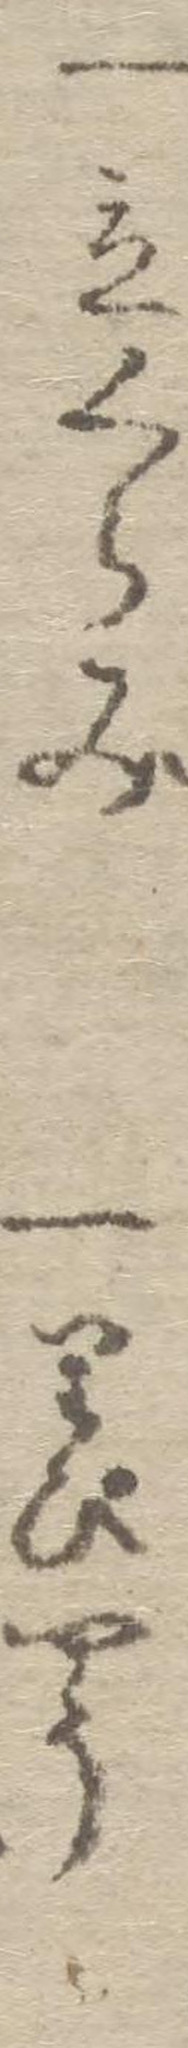一立くらみ一りびやう
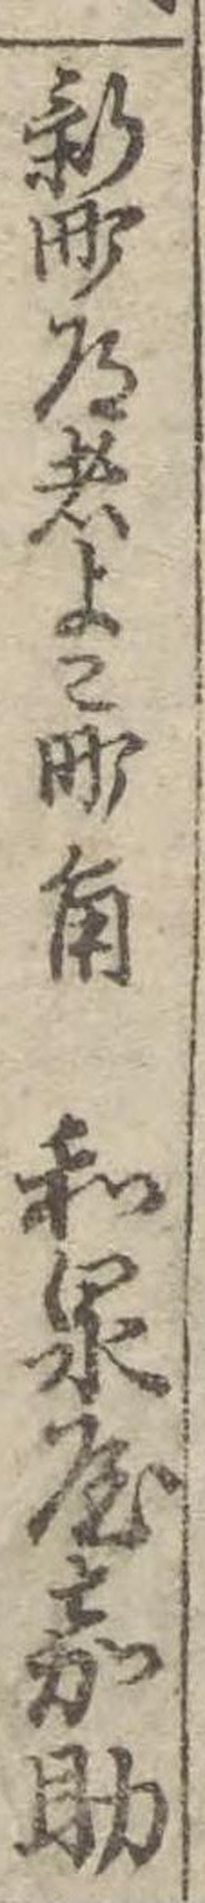新町道者よこ町角和泉屋嘉助
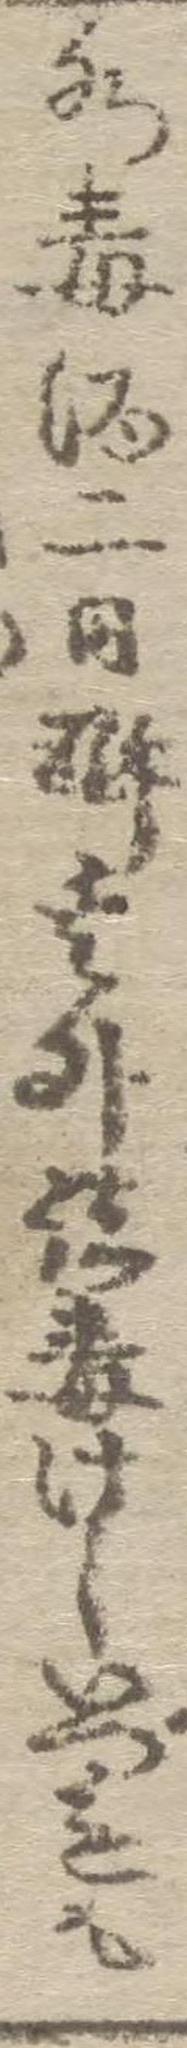水毒酒二日酔其外諸毒けしいづれも
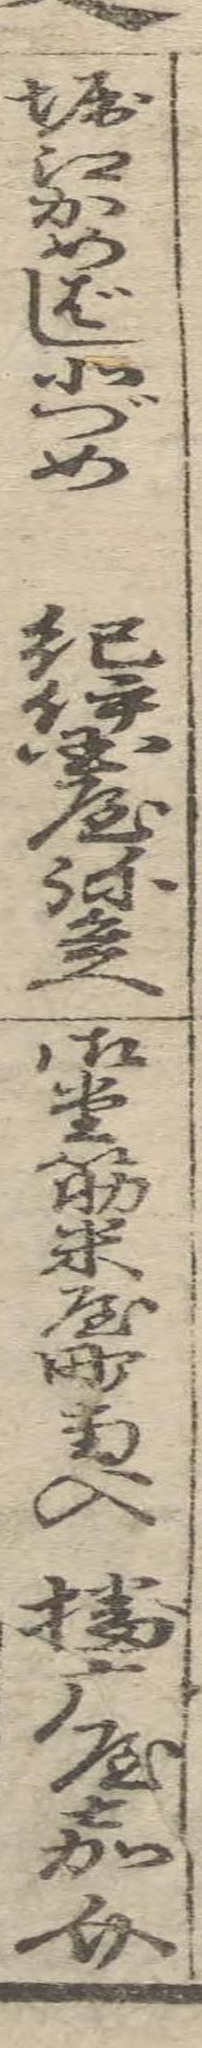堀江かめばし北づめ紀伊国屋弥兵へ
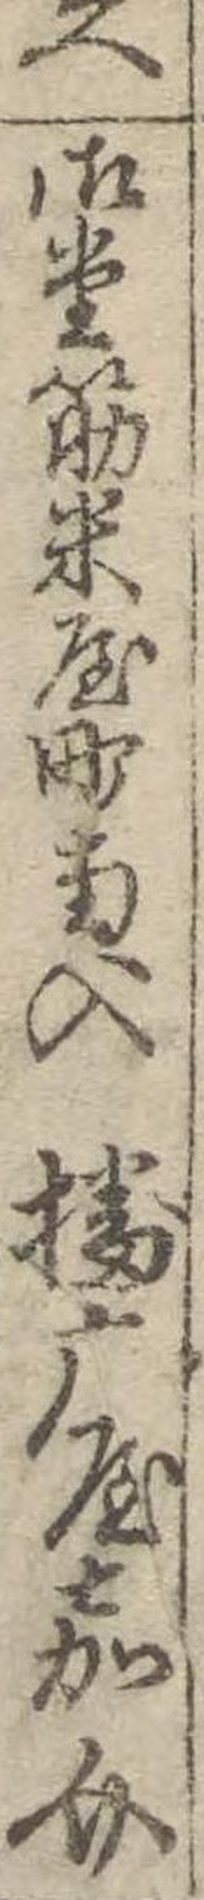御堂筋米屋町南へ入播磨屋嘉介
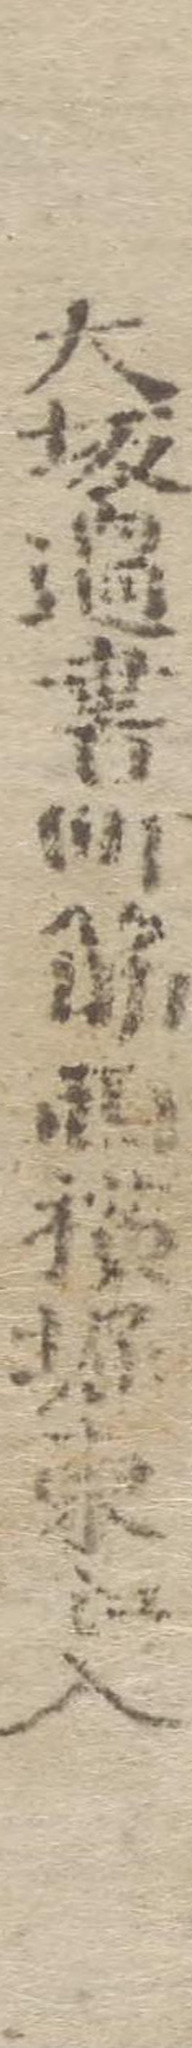大坂過書町筋西横堀東江入
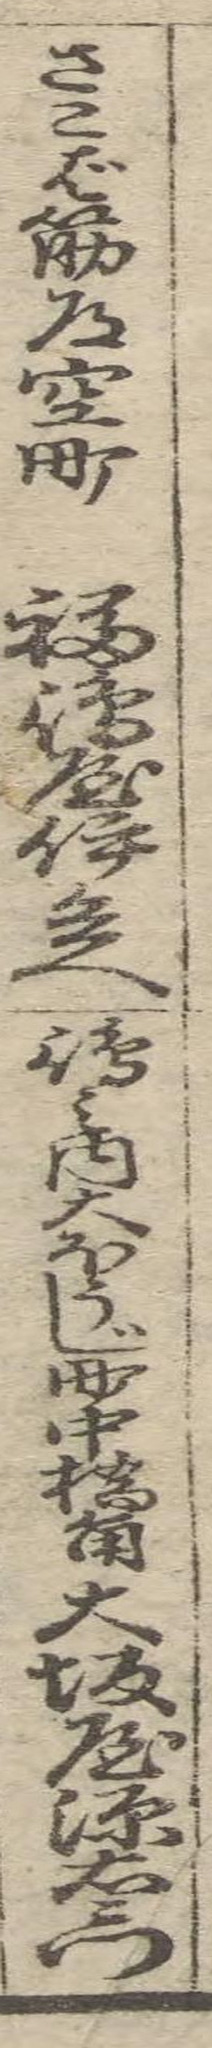さこば筋道空町福嶋屋伊兵へ
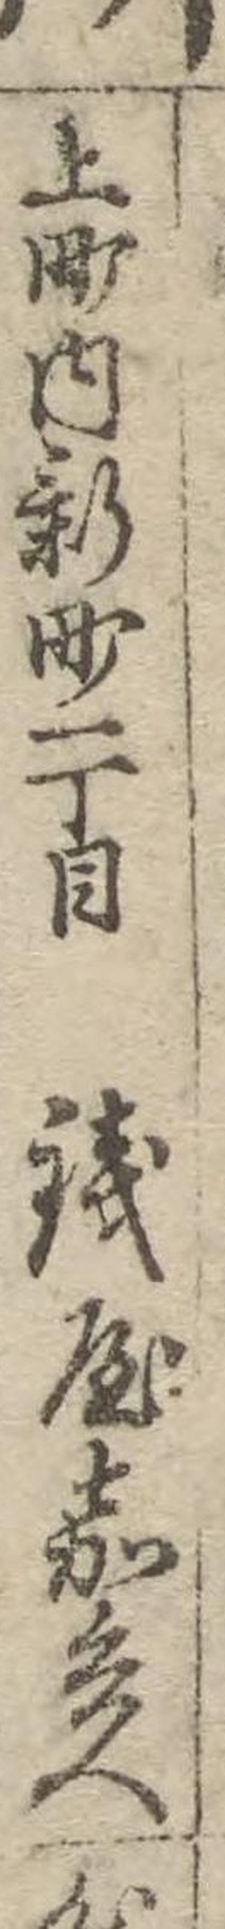上町内新町一丁目銭屋嘉兵へ
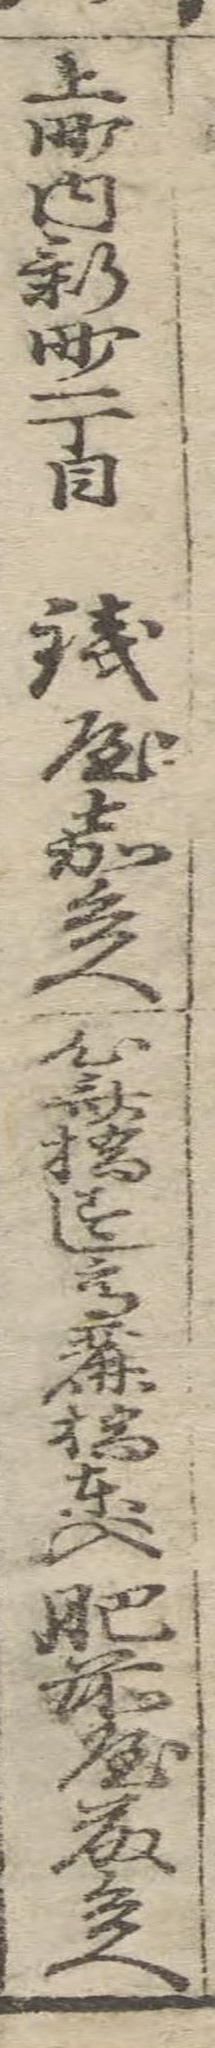上町内新町一丁目銭屋嘉兵へ
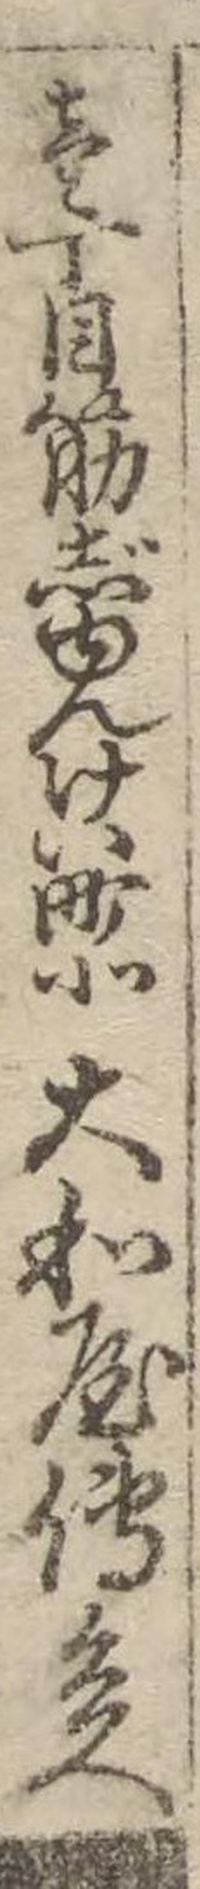壱丁目筋じゆんけい町北大和屋伝兵へ

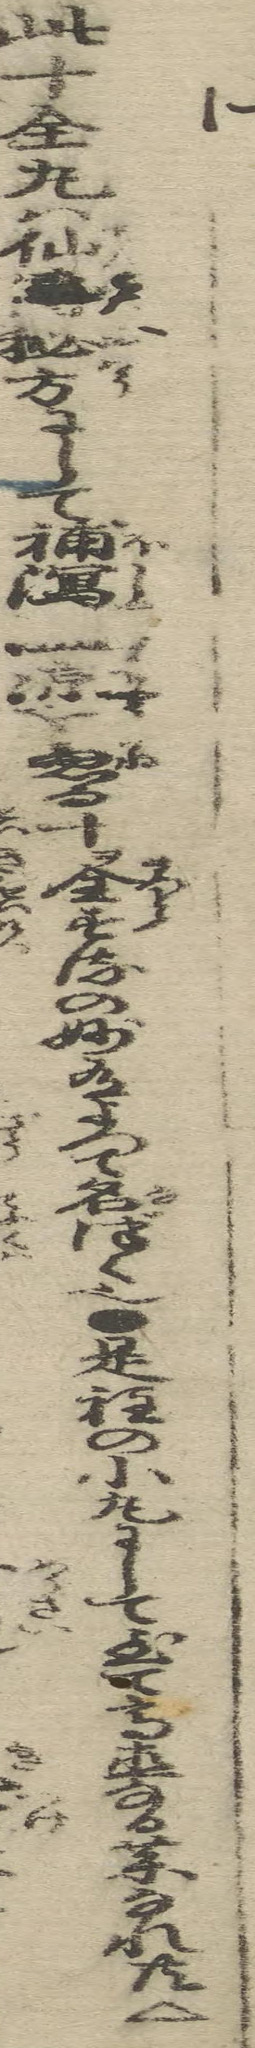此十全丸は仙伝秘方にして補瀉涼を兼而十を全するの妙有よつて名づく也●是程の小丸にして至て高直なる薬なれ共△
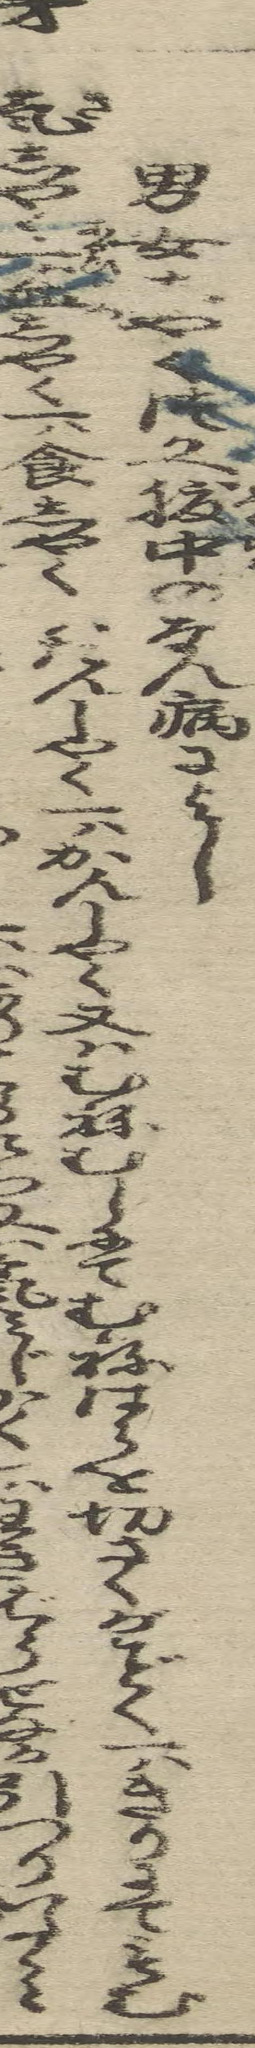気しやく一は血しやく一は食しやくはたんしやく一はかんしやく又はむねむしにてむねはらを切さくがごとく一はきりにてもむ
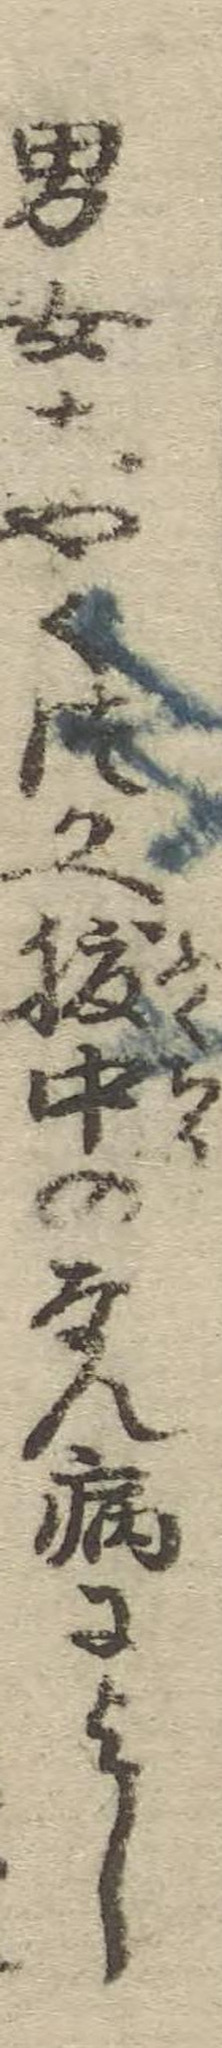男女しやくつかへ腹中のなん病によし
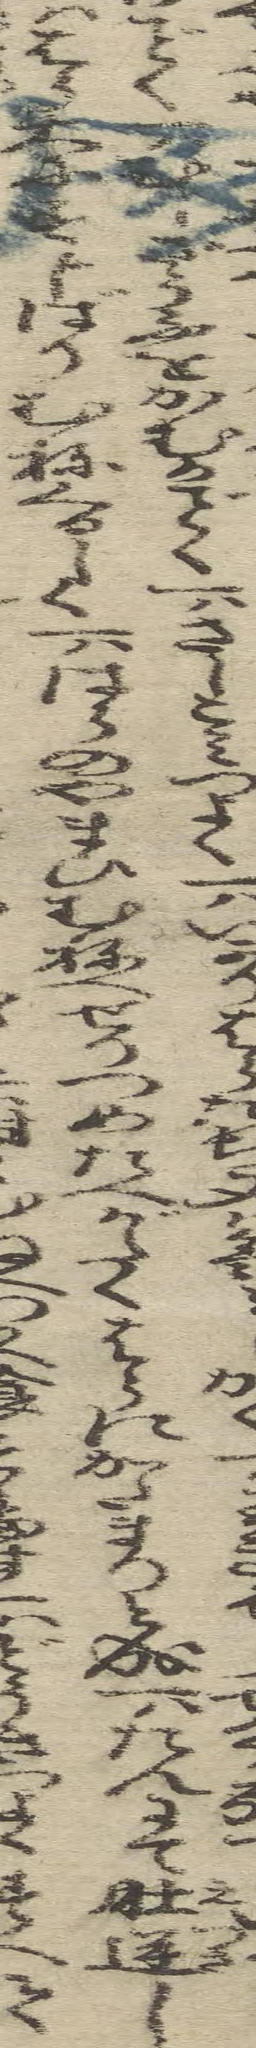一ははら大にすじばりむねくるしく一ははらのやまひむねへせりつめたへがたくはらにかたまりと成一はたんにて肚逆し
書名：浪華薬種問屋能書張交帖. 二
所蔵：国立国会図書館 National Diet Library, JAPAN
